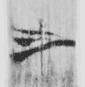之
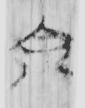余
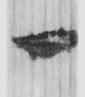一
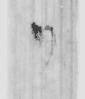人
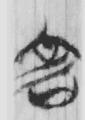害
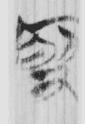{戶刀又}
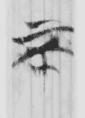不
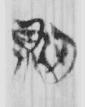則
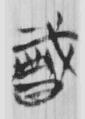戠
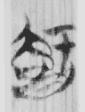智
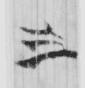之
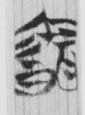{尒䎽}
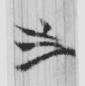之
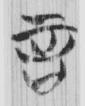言
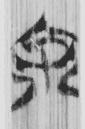余
